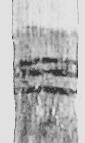三
